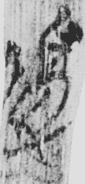○（易）
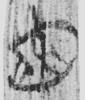○（牙）
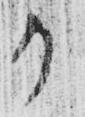刀（刁）
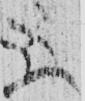之
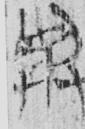與
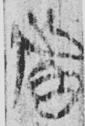偖（者）
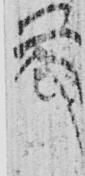而
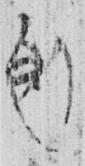○（食）
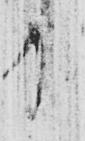人
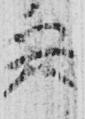亓（其）
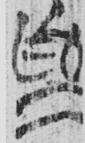爲
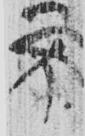不
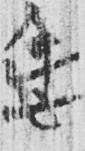○（仁）
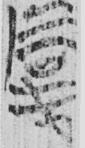厚
